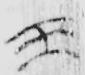王
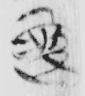婁
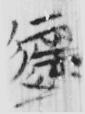逯
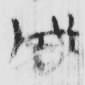戠
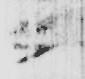之
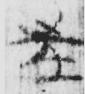往
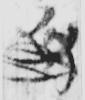○（夏）
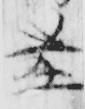往
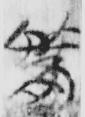筩
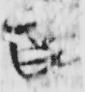爲
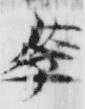李
